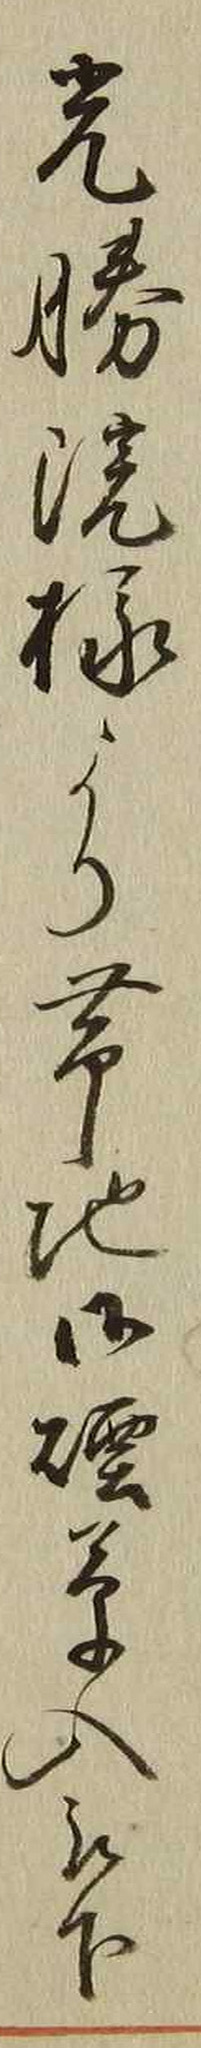光勝院様より帯地御煙草入被下
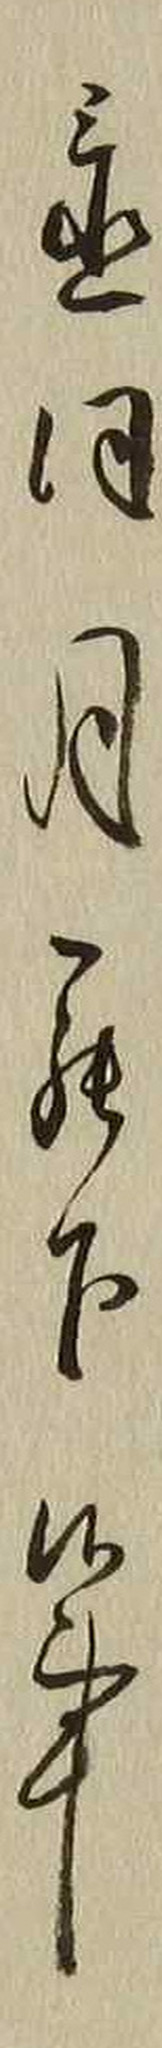置同月罷下候事
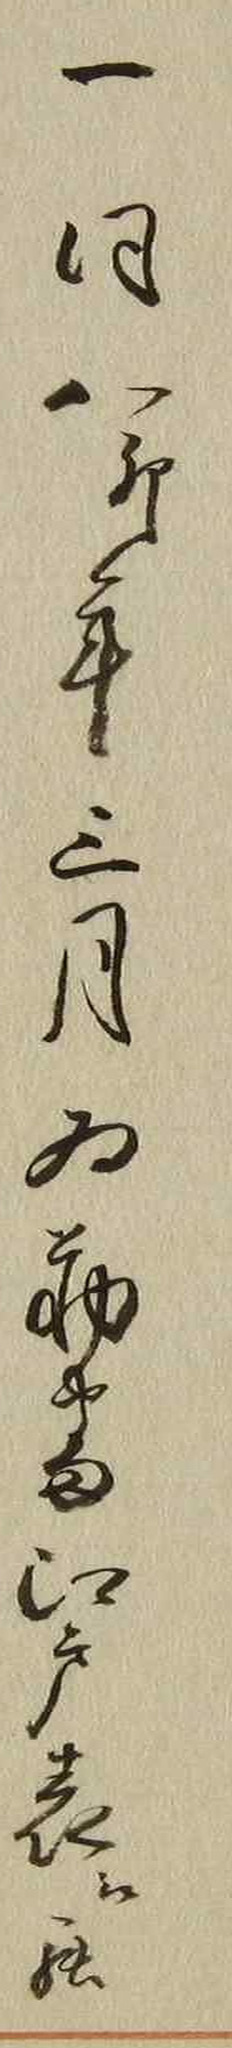一同八卯年三月為勤番江戸表江罷
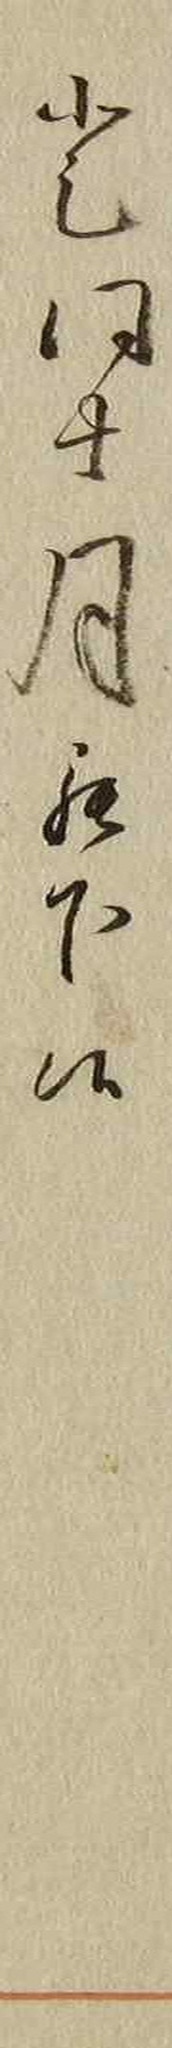登同十月罷下候
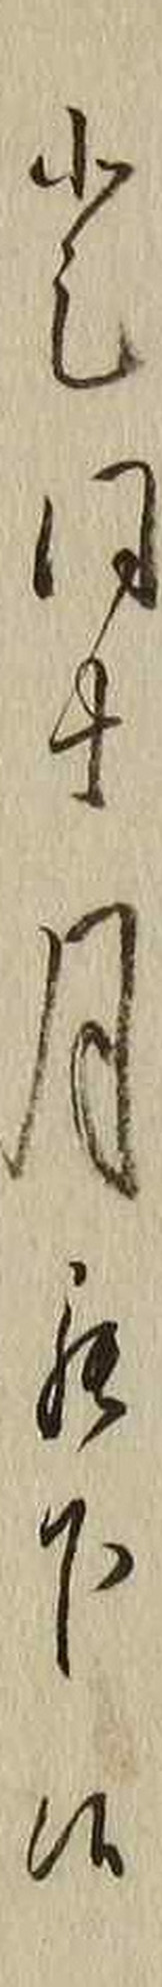登同十月罷下候
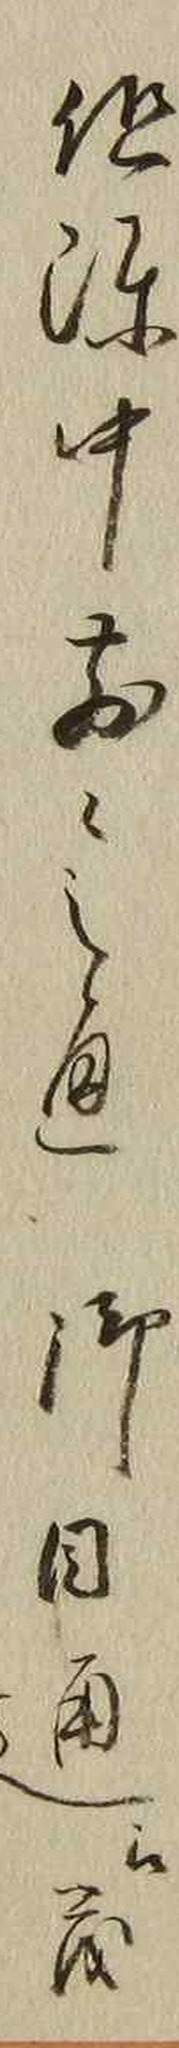但陣中前々之通御目通江茂
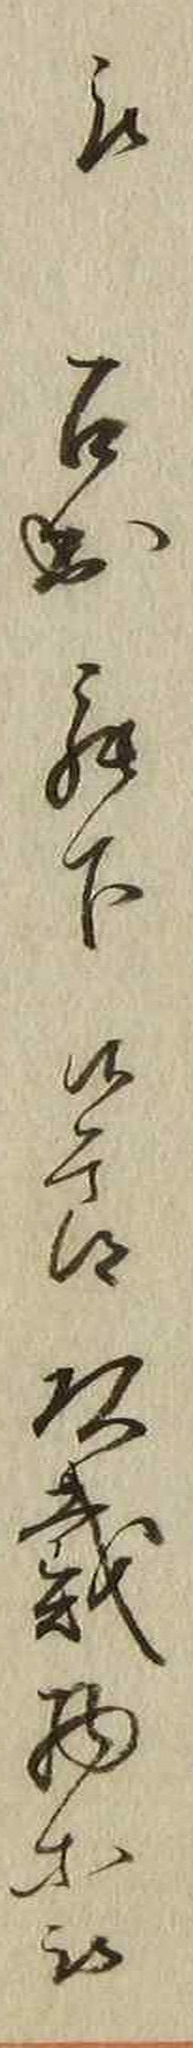被召出罷下候節頂戴物等被
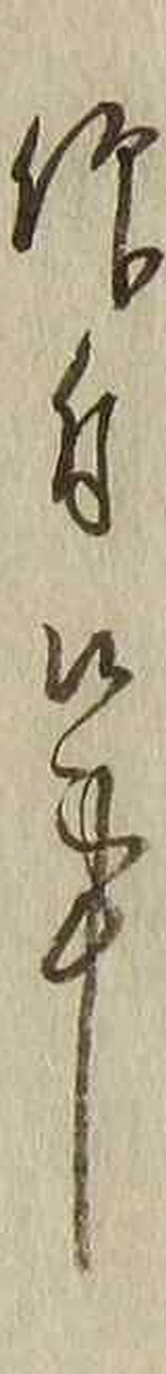仰付候事
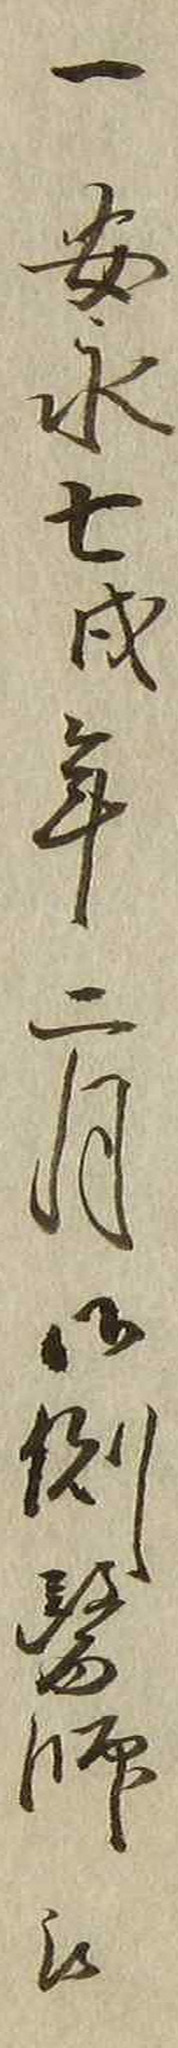一安永七戌年二月御側医師被
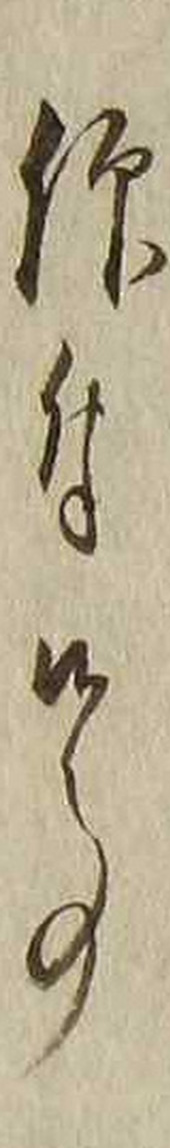仰付候事
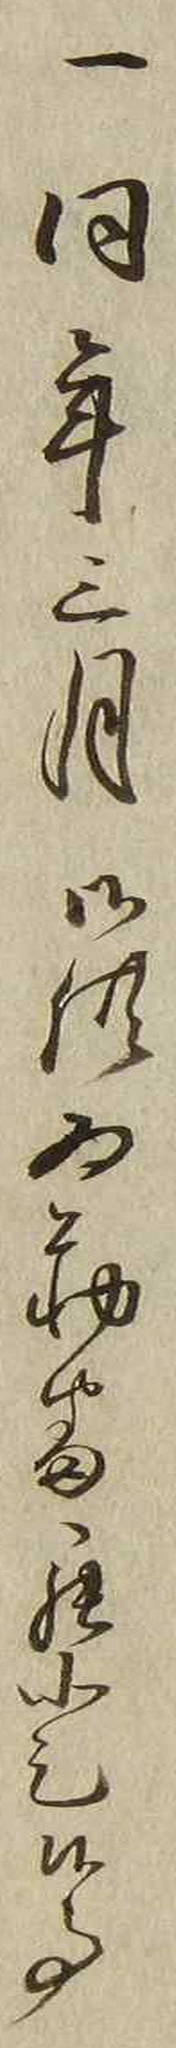一同年三月御供為勤番罷登候事
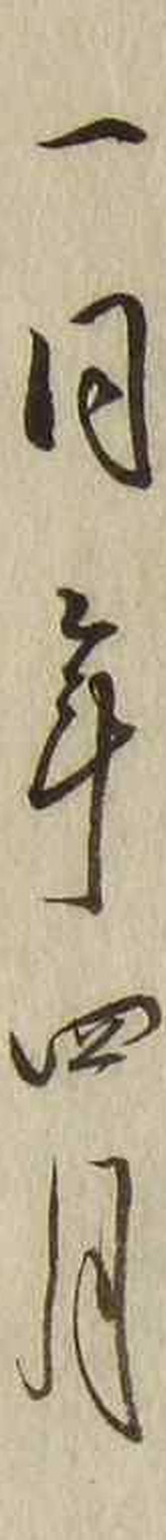一同年四月

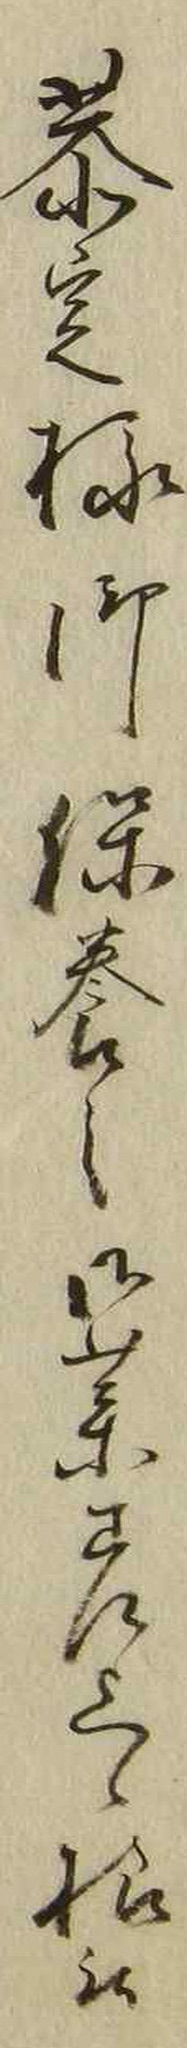恭定様御保養之御薬差上候様被
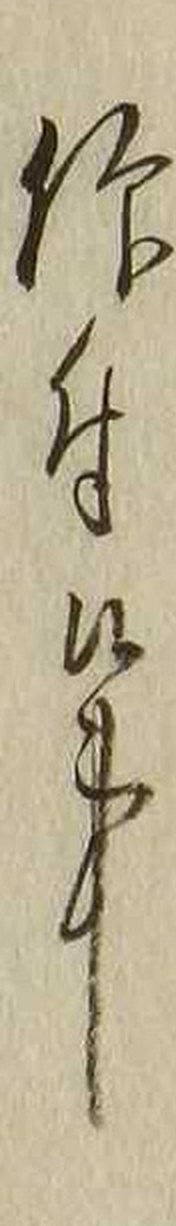仰付候事
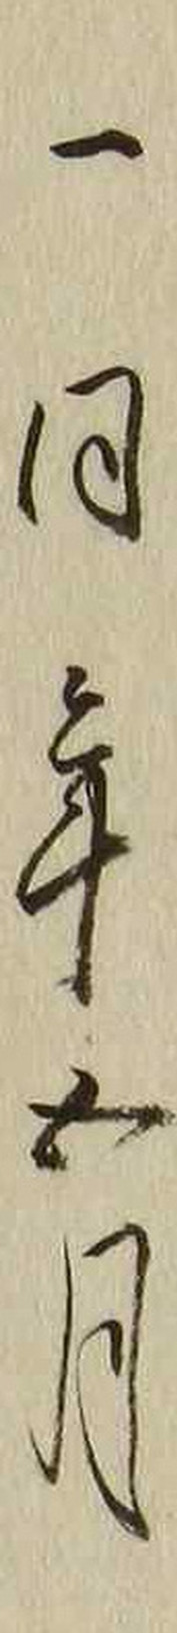一同年五月
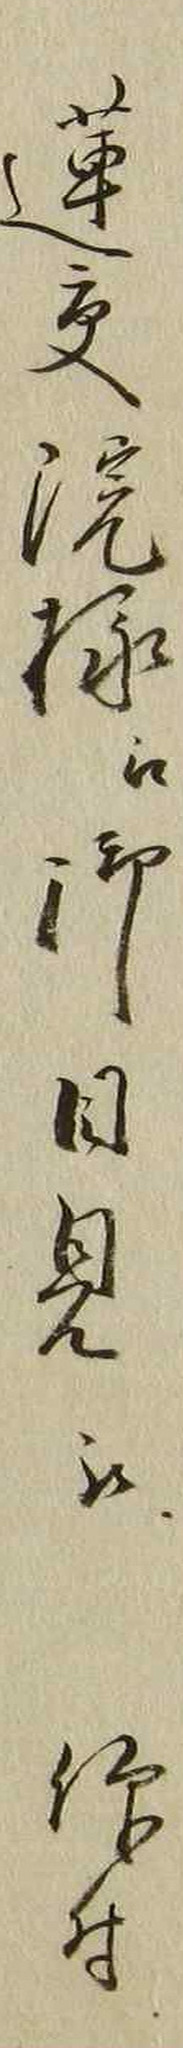蓮受院様江御目見被仰付
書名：諸士系譜　巻之68　を之部2
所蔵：会津若松市立会津図書館
